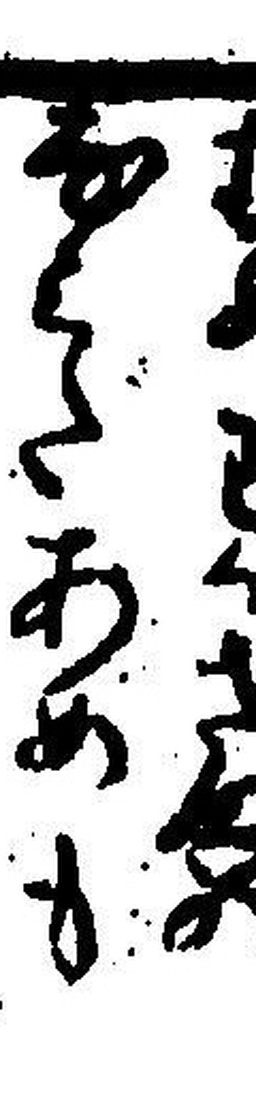なみだあめも
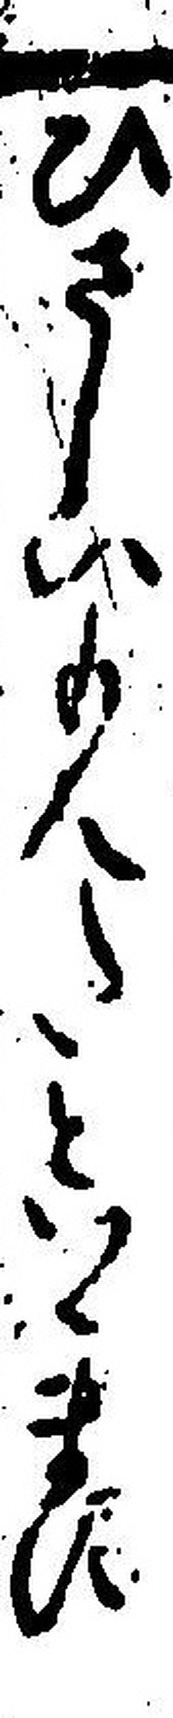ひさしいもんたといゝます
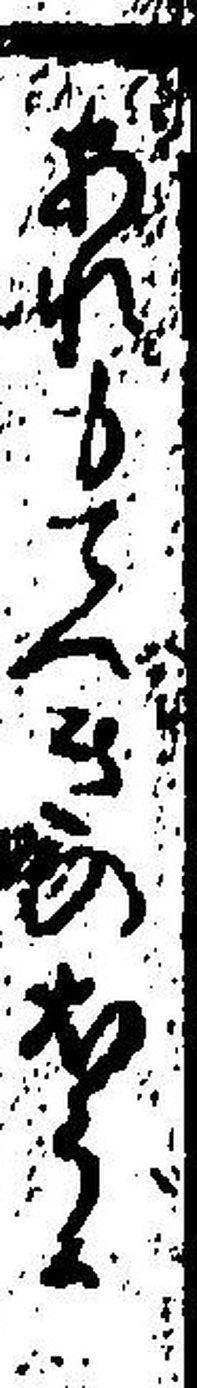あれもてんきのほうか
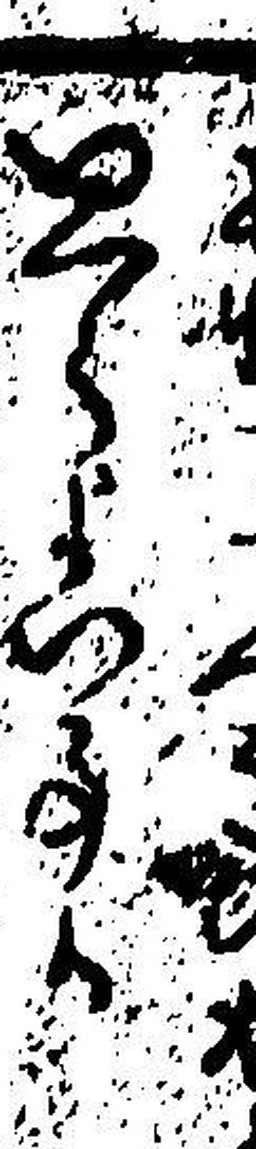いくらよい事か
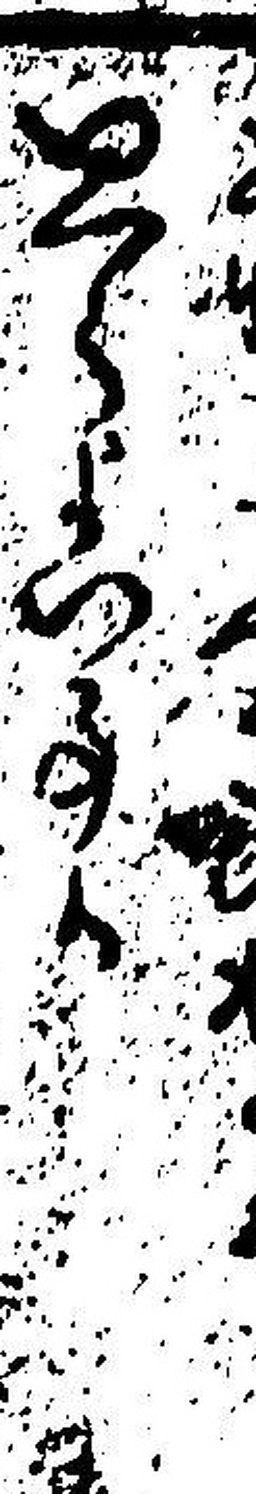いくらよい事か
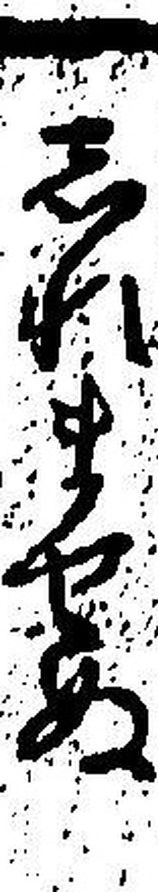しれませぬ
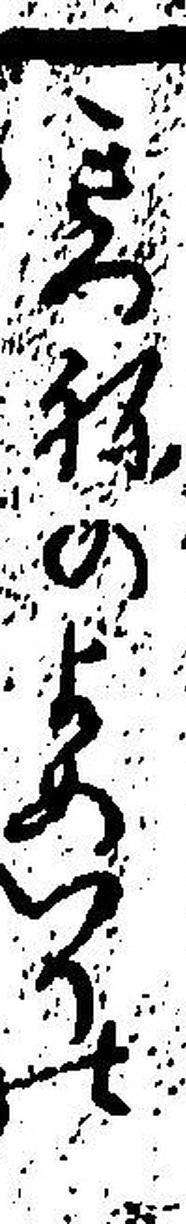きつねのよめいりの
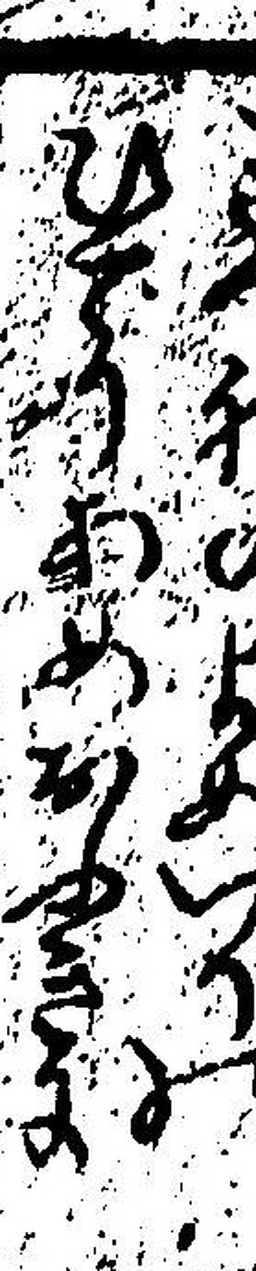ひでりあめおふきに
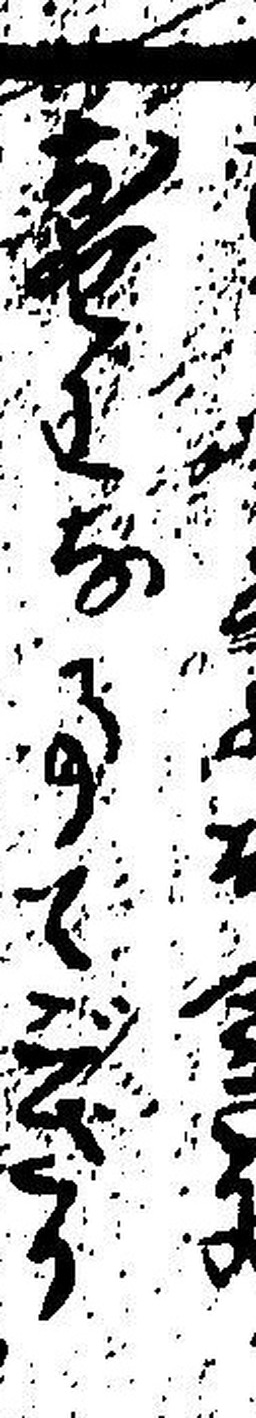おせわな事てござり
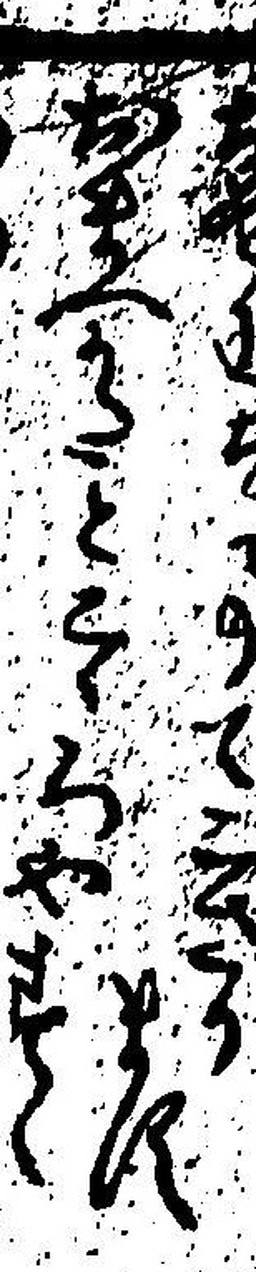おまへかたとこゝろやすく
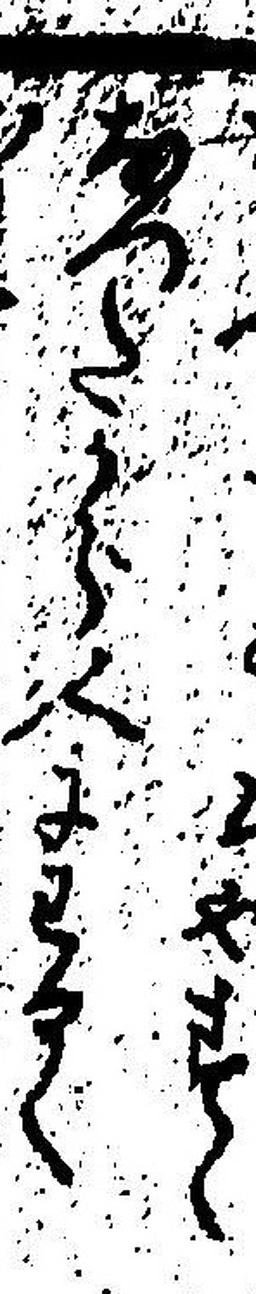なつたから人にわるく
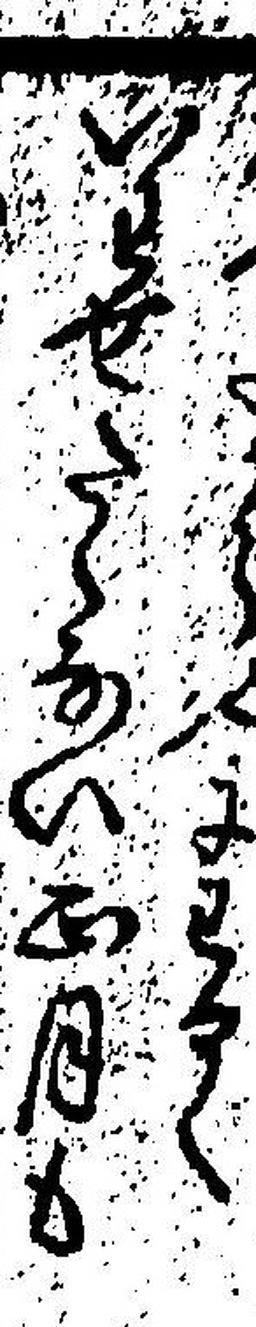いわせたくない正月も
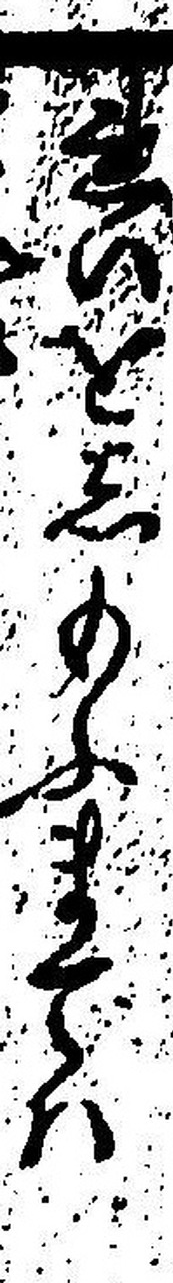れいをしもふまては
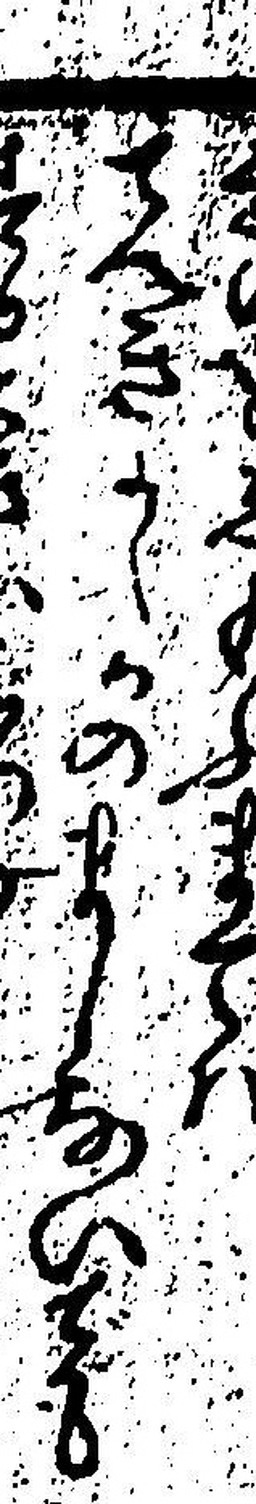てんきよくかのましないでも
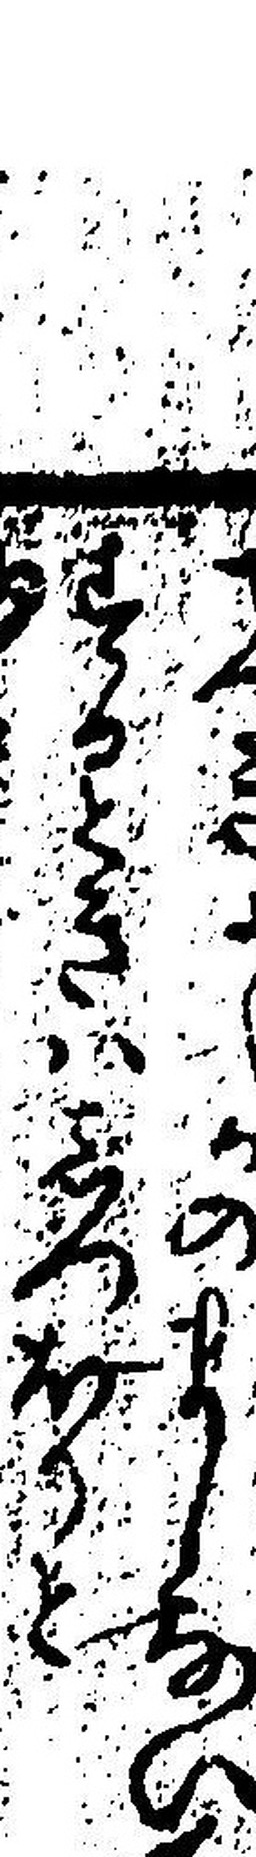するときはしつほりと
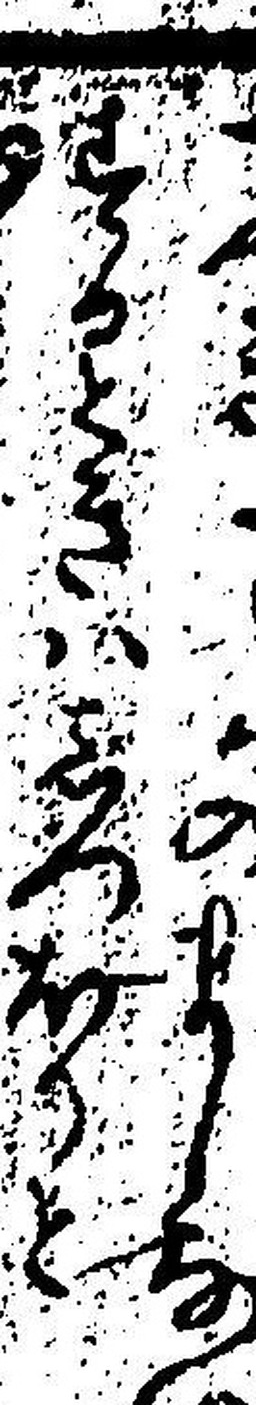するときはしつほりと
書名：牡丹餅棚有 / 市場通笑作
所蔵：東京大学総合図書館 General Library in the University of Tokyo, JAPAN
